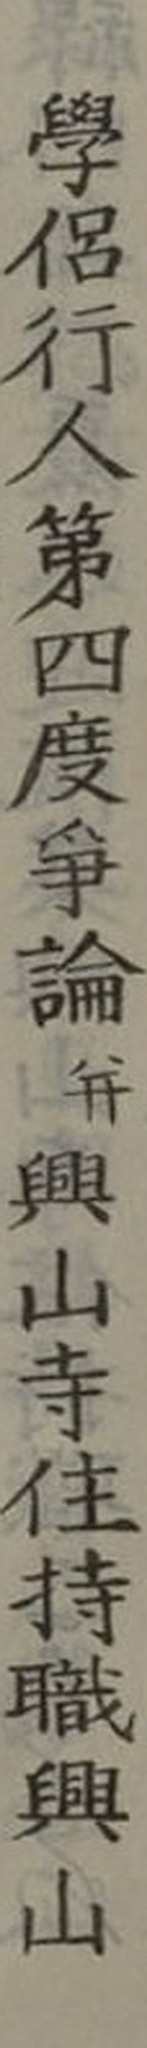學侶行人第四度爭論并興山寺住持職興山
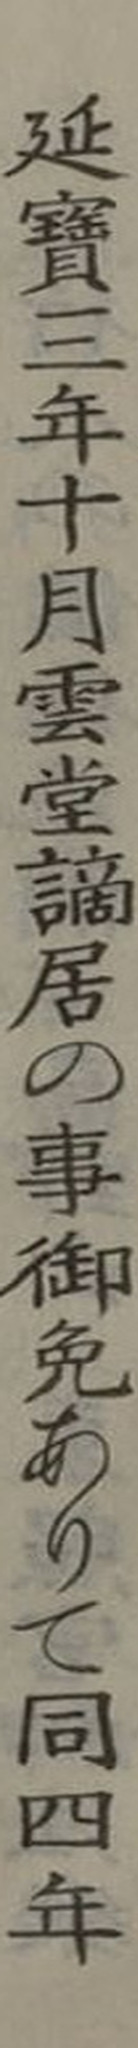延寶三年十月雲堂謫居の事御免ありて同四年
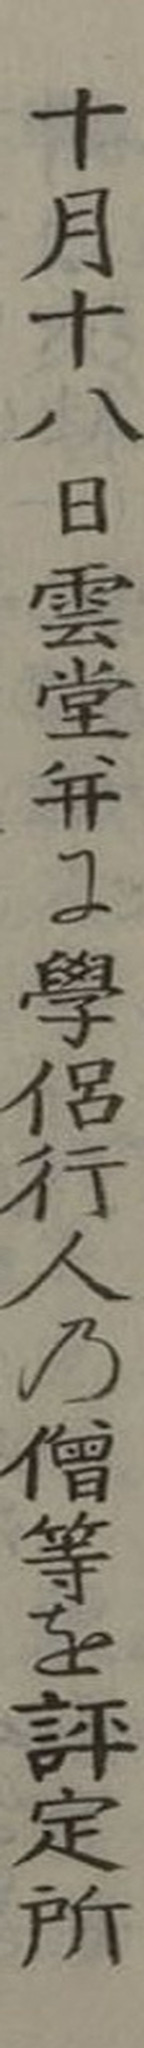十月十八日雲堂并に學侶行人の僧等を評定所
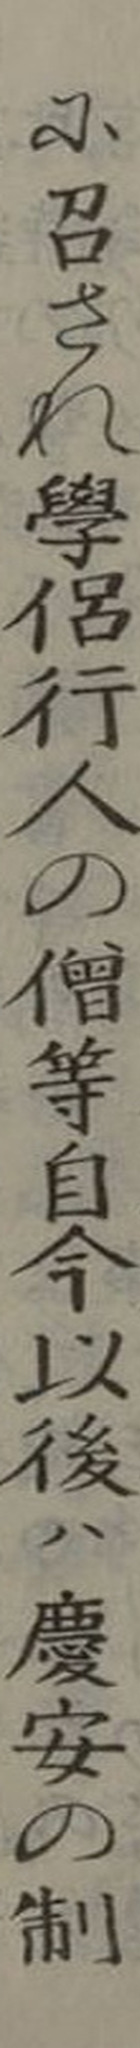に召され學侶行人の僧等自今以後は慶安の制
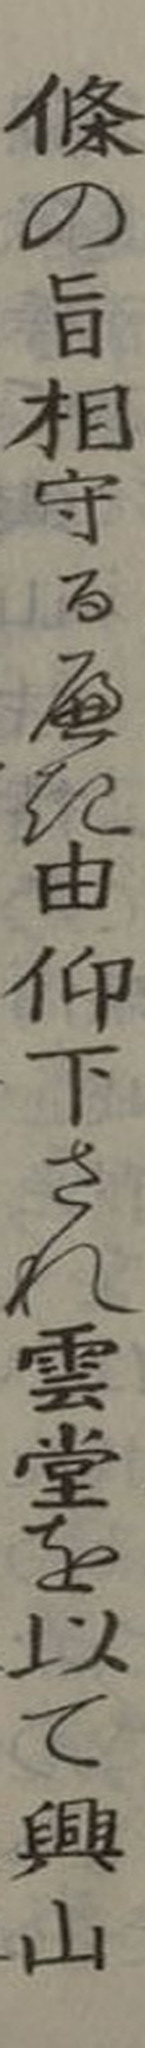條の旨相守るへき由仰下され雲堂を以て興山
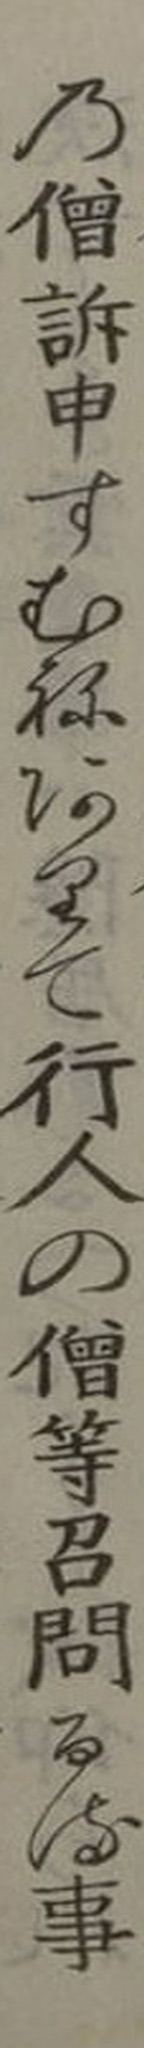の僧訴申すむねありて行人の僧等召問るる事
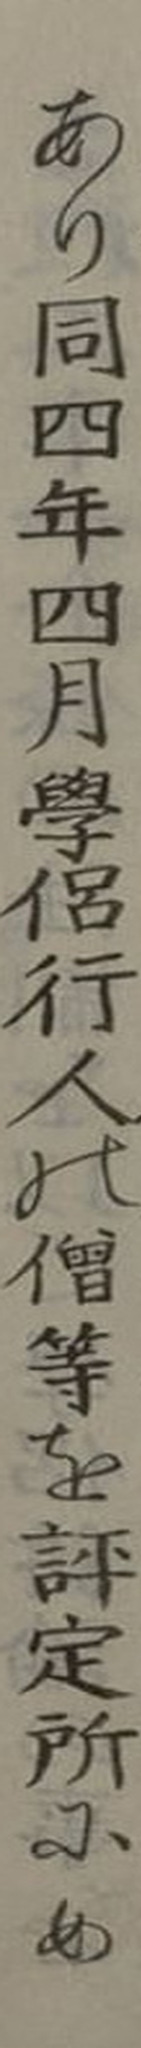あり同四年四月學侶行人の僧等を評定所にめ

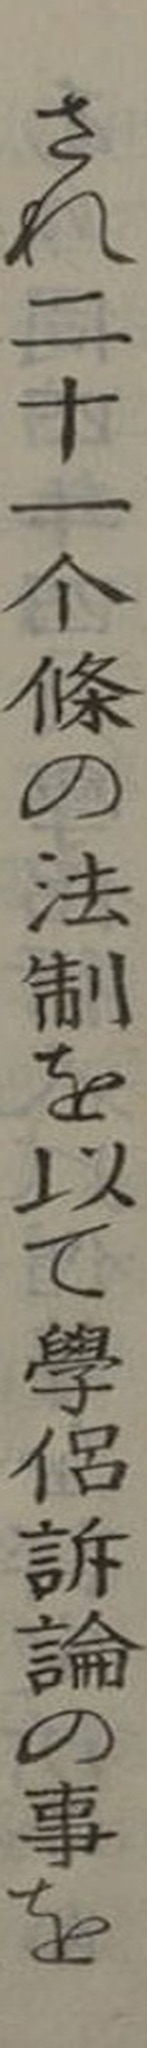され二十一个條の法制を以て學侶訴論の事を
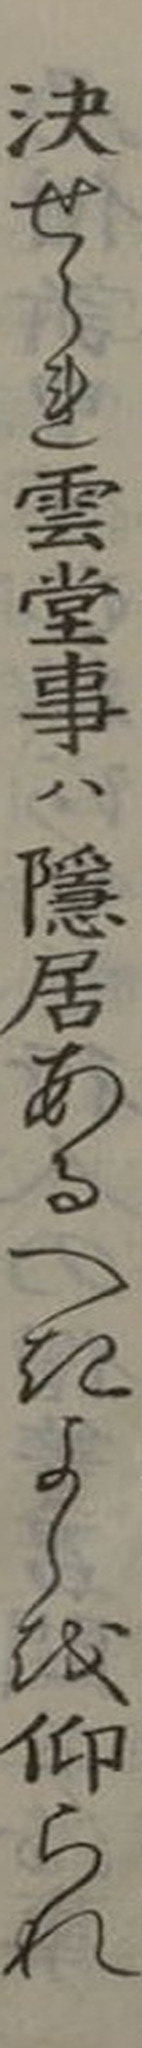決せられ雲堂事は隱居あるへきよしを仰られ
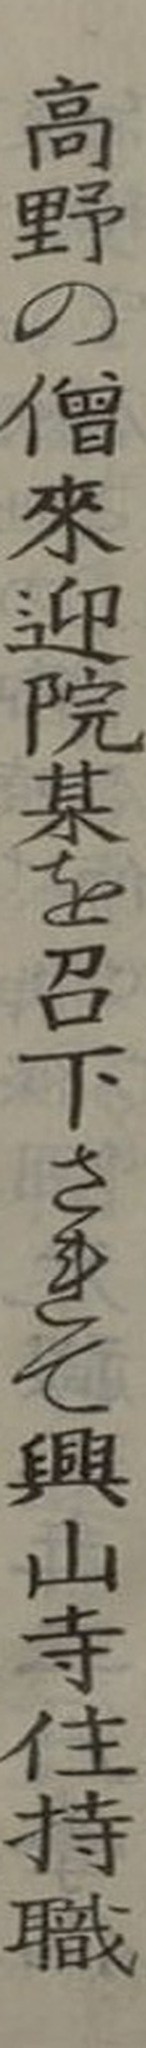高野の僧來迎院某を召下されて興山寺住持職
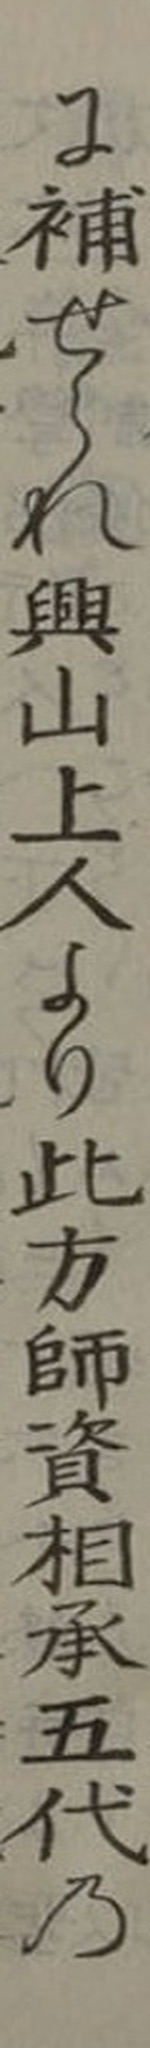に補せられ興山上人より此方師資相承御代の
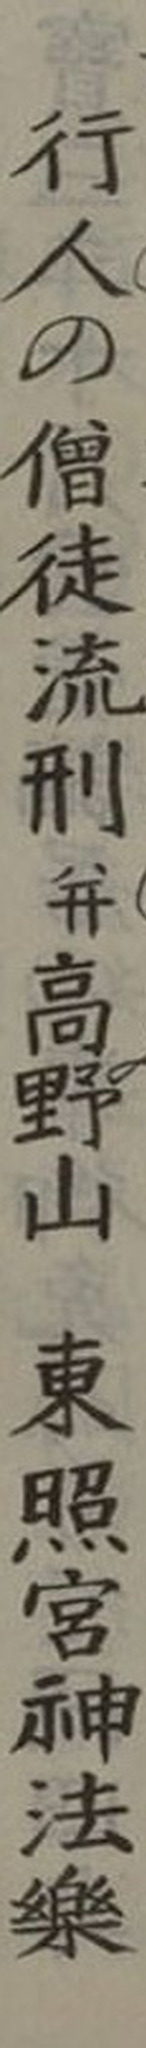行人の僧徒流刑并高野山東照宮神法樂
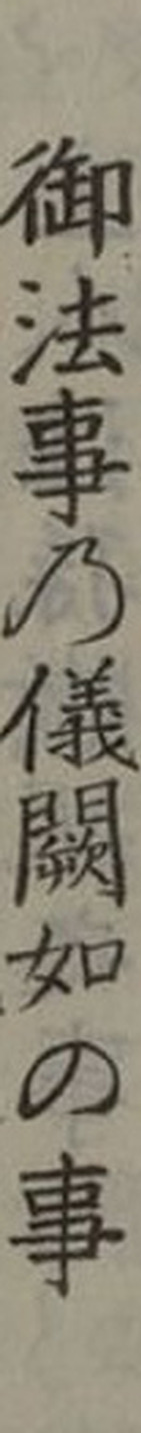御法事の儀闕如の事
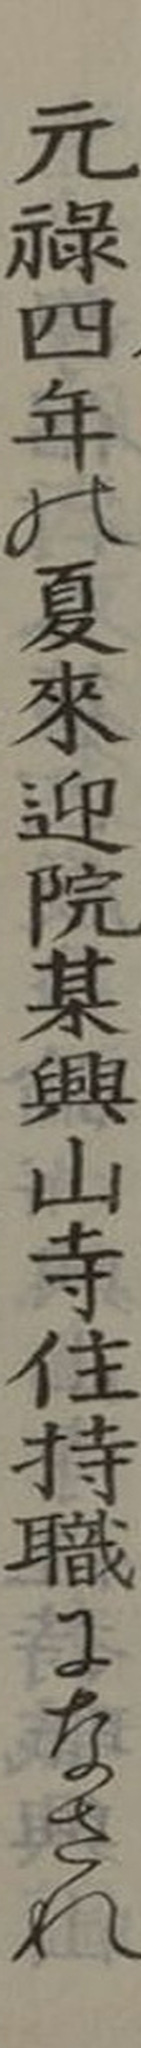元祿四年の夏來迎院某興山寺住持職になされ
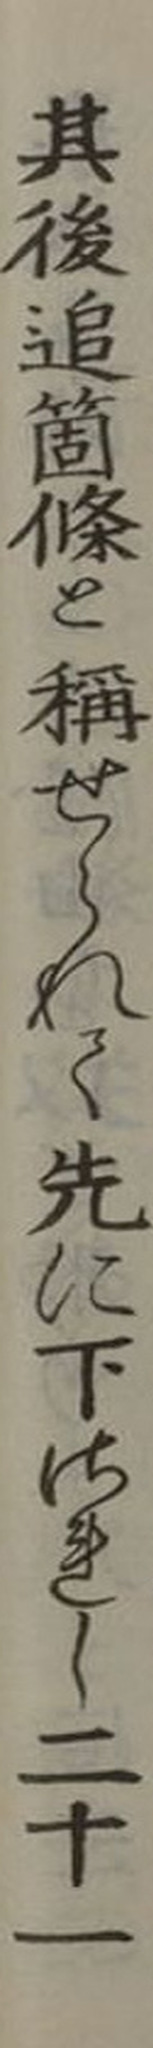其後追箇條と稱せられて先に下されし二十一
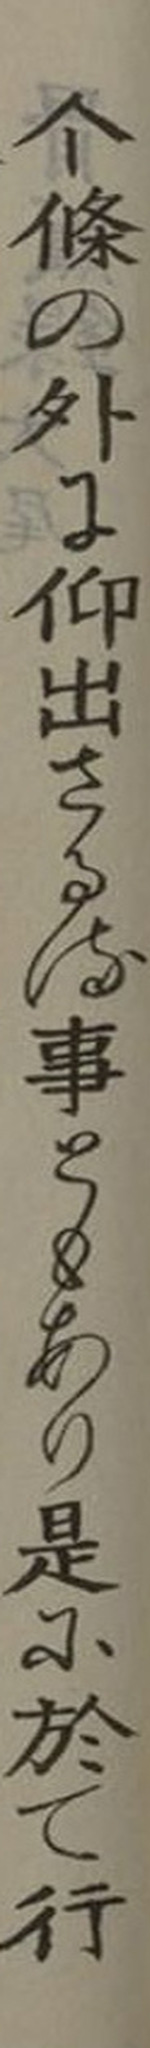个條の外に仰出さるる事ともあり是に於て行
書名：骨董録
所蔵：University of the Ryukyus Library
